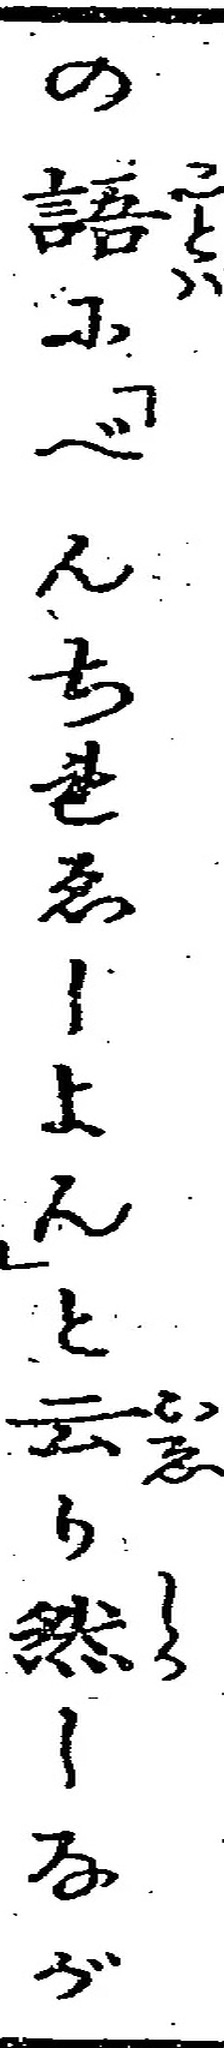の語に「べんちれゑしよん」と云り然しなが
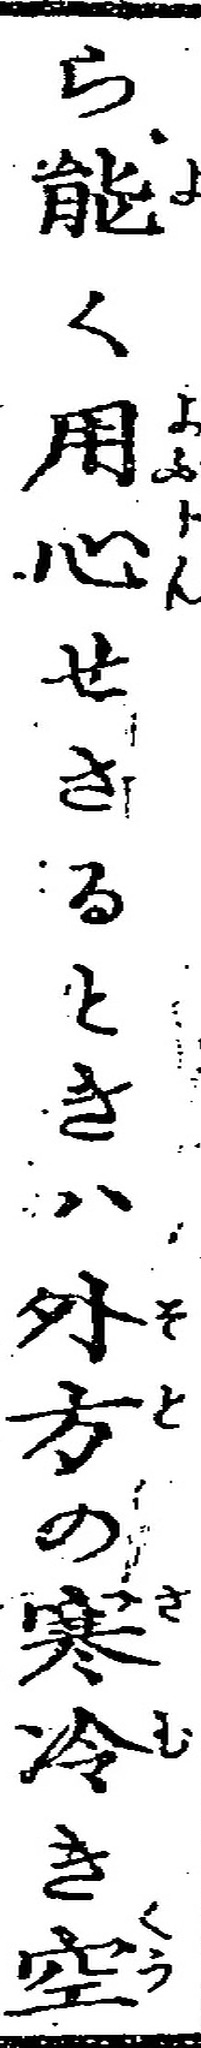ら能く用心せさるときは外方の寒冷き空
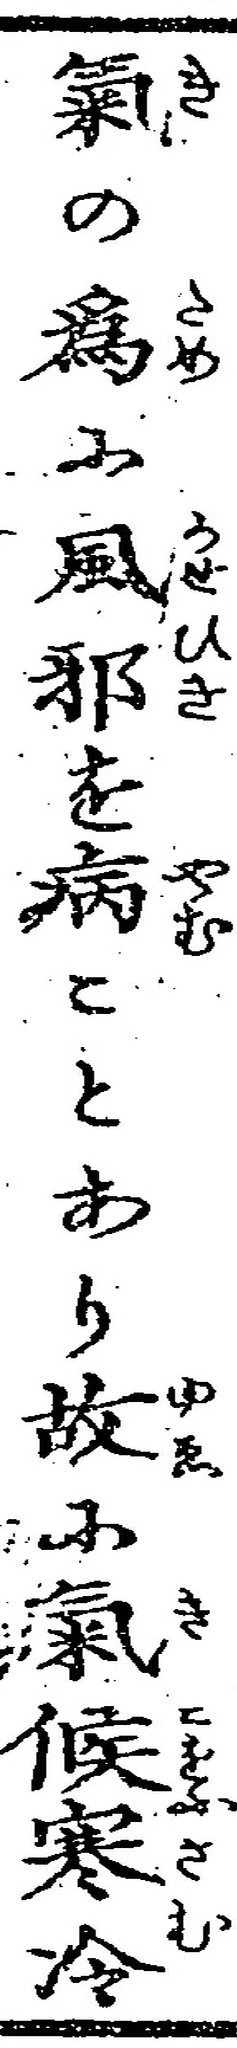気の為に風邪を病ことあり故に気候寒冷
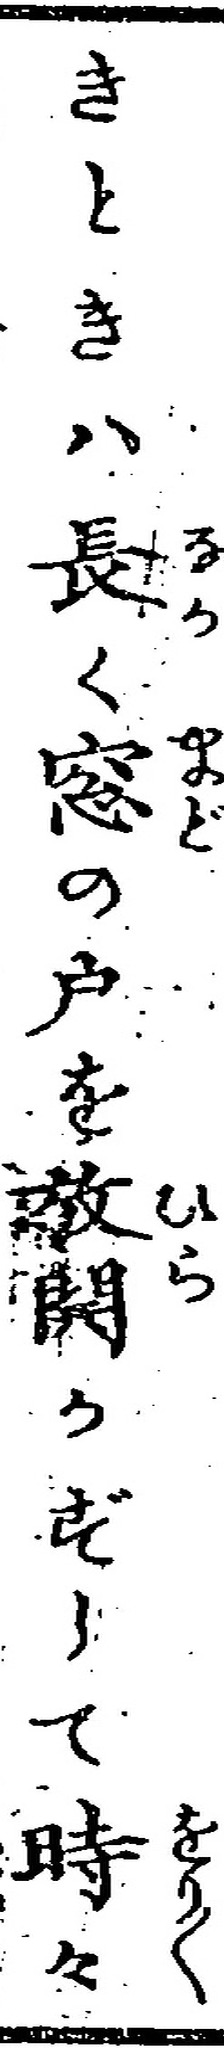きは長く窓の戸を放開かずして時々
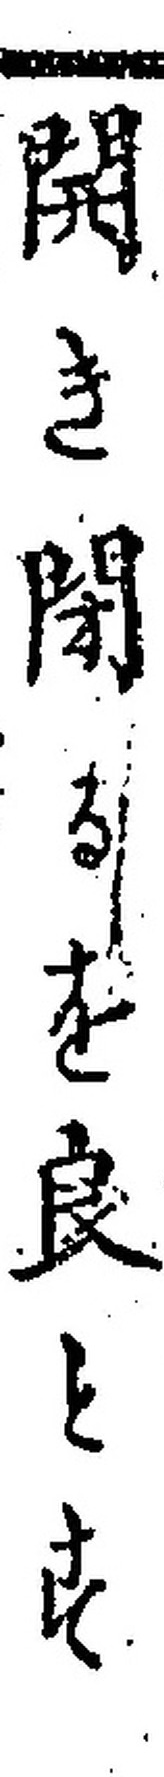開き閉るを良とす
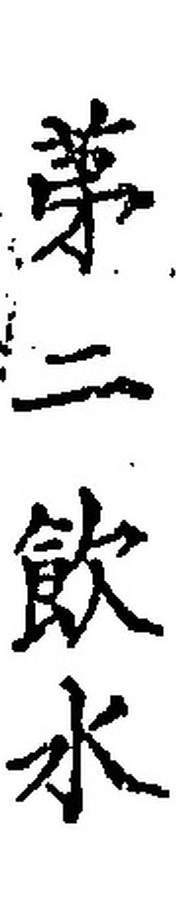第二飲水
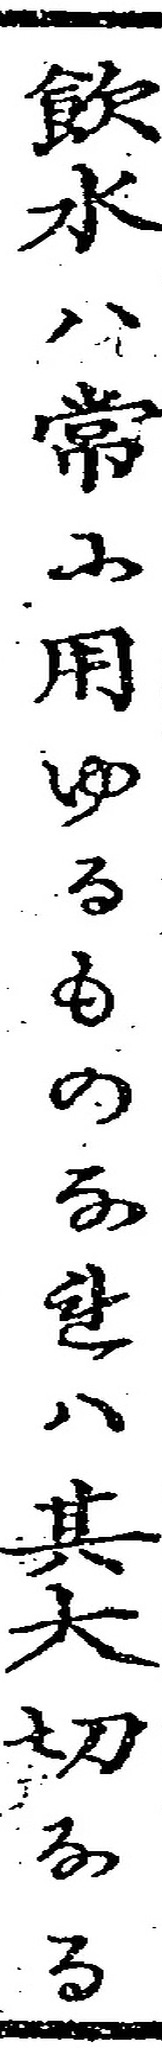飲水は常に用ゆるものなれは其大切なる
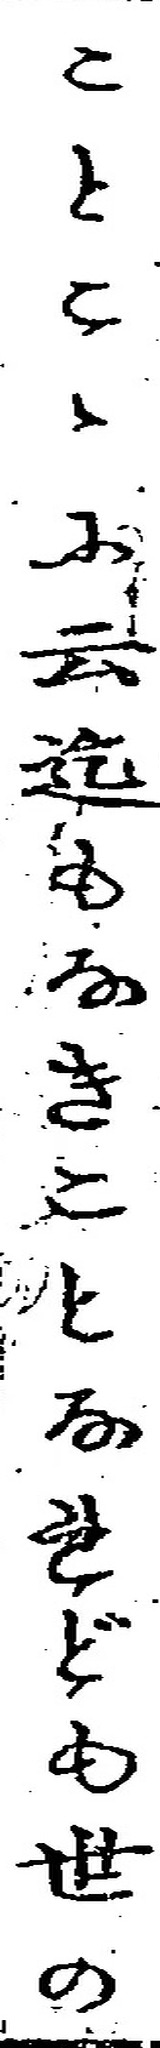ことこゝに云迄もなきことなれども世の
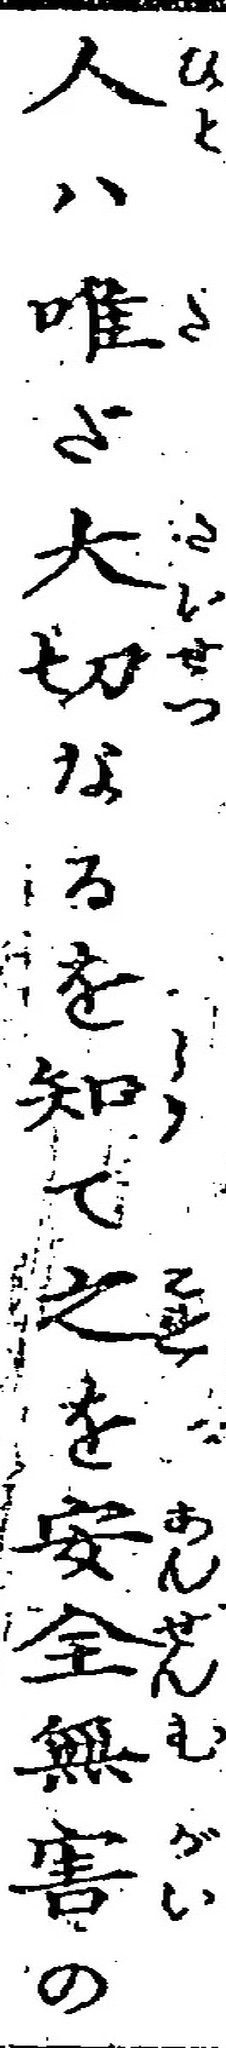人は唯だ大切なるを知て之を安全無害の

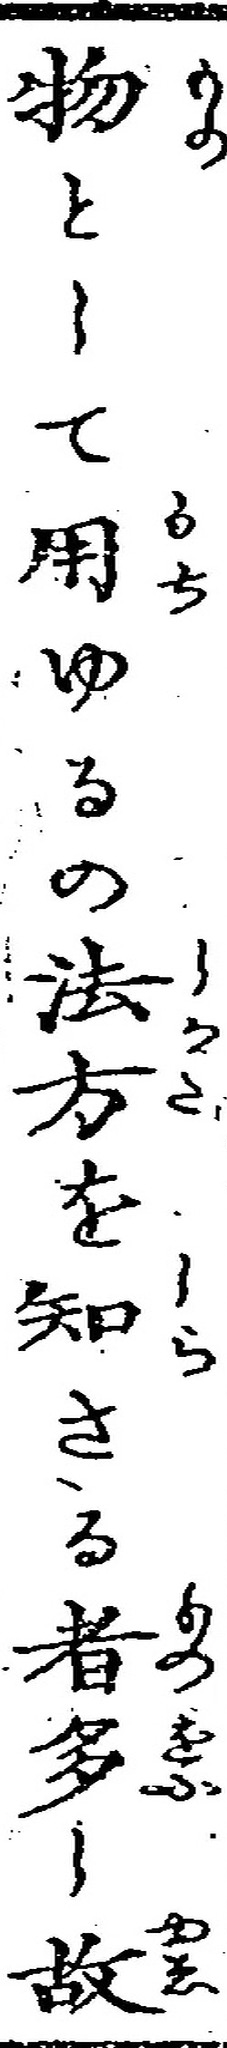物として用ゆるも法方を知さる者多し故
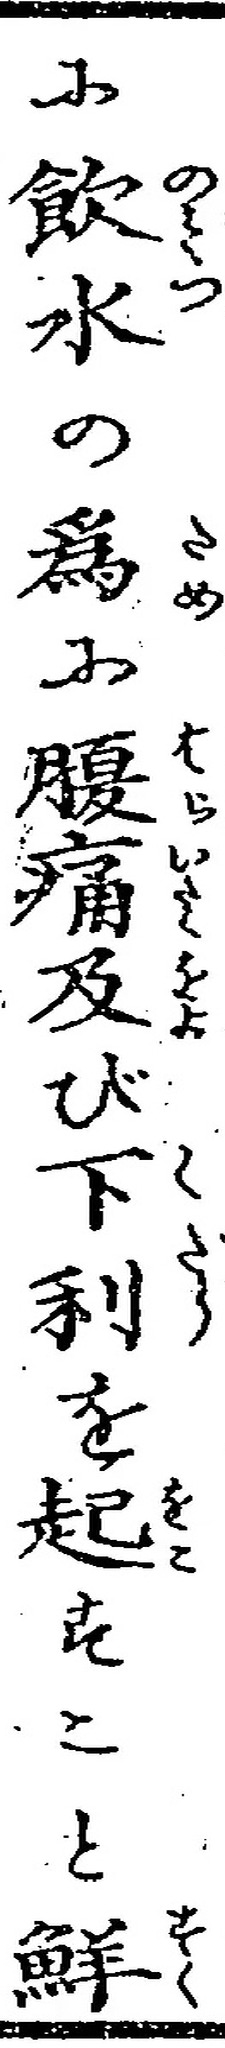に飲水の為に腹痛及び下利を起すこと鮮
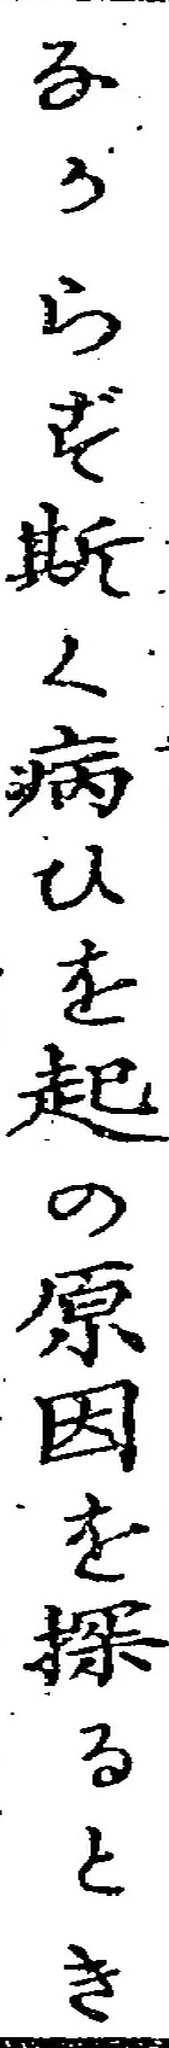なからず斯く病ひを起の原因を探るとき
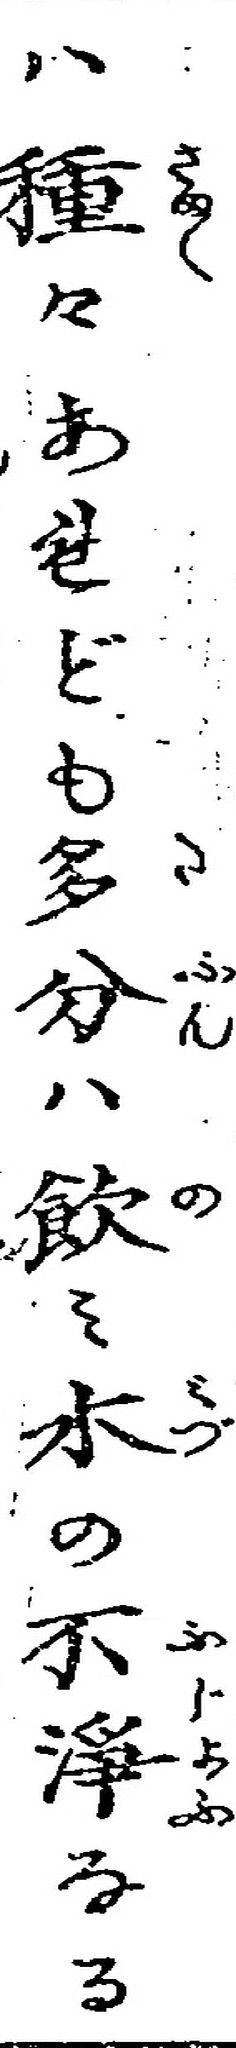種々あれども多分は飲み水の不浄なる
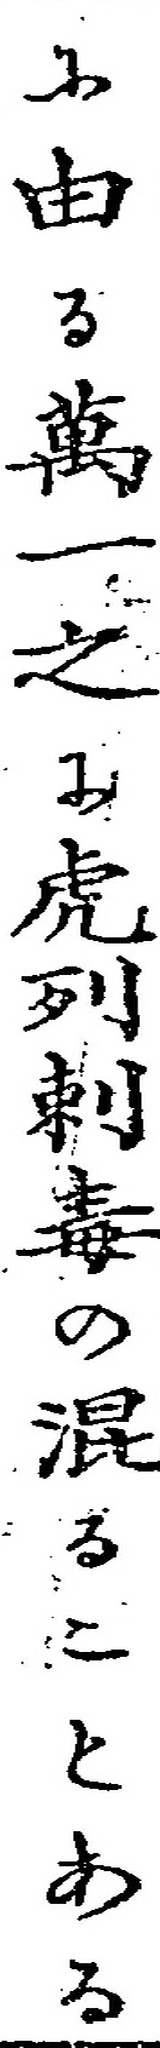に由る万一之に虎列刺毒の混ることある
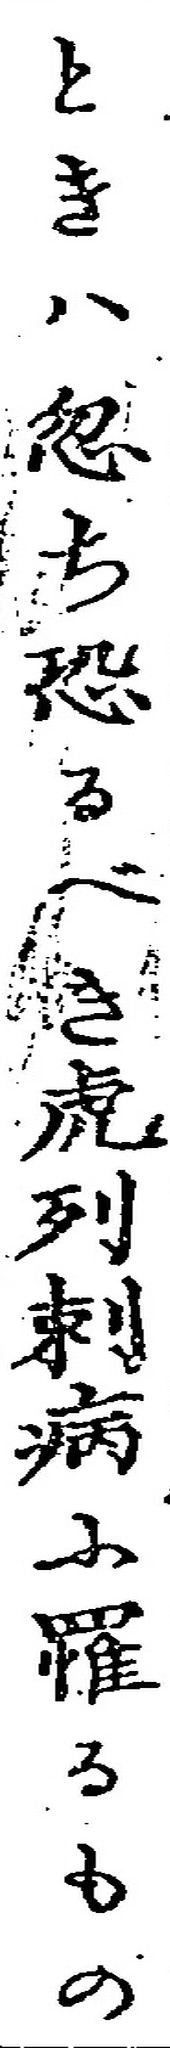ときは忽ち恐るべき虎列刺病に罹るもの
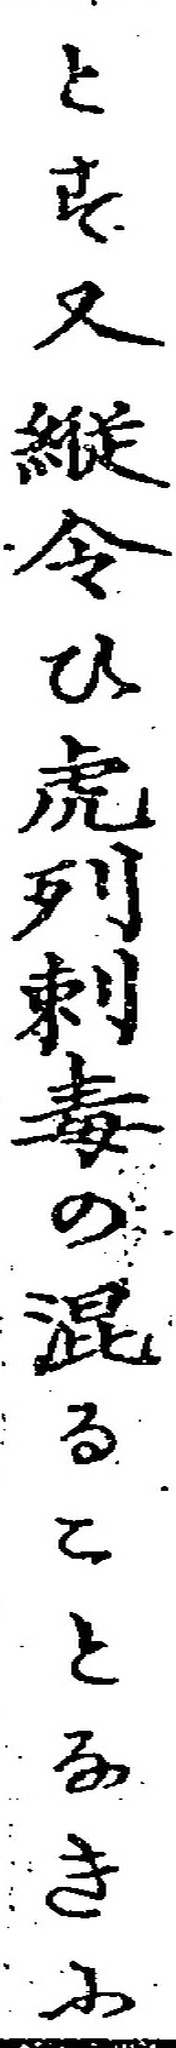とす又縦令ひ虎列刺毒の混ることなきに
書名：コレラ予防命乃後見
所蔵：国立国会図書館 National Diet Library, JAPAN
